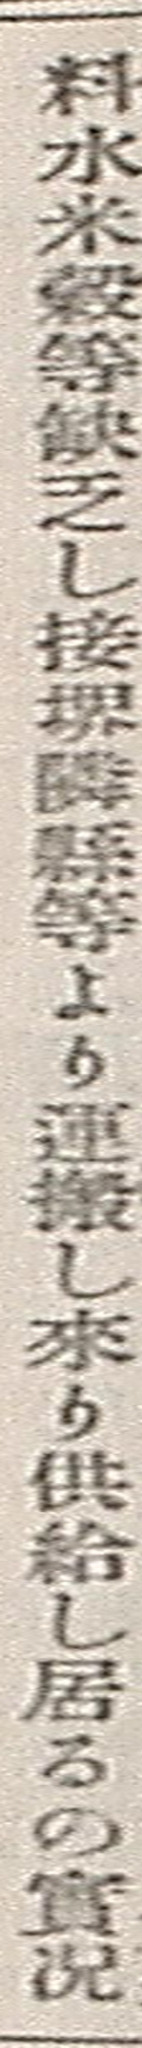料水米穀等缺乏し接堺隣県等より運搬し来り供給し居るの実況
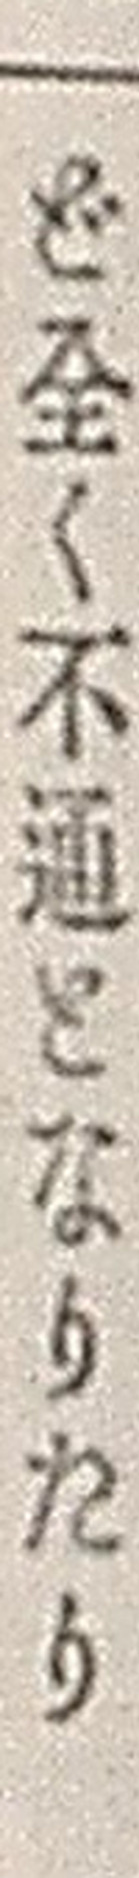ど全く不通となりたり
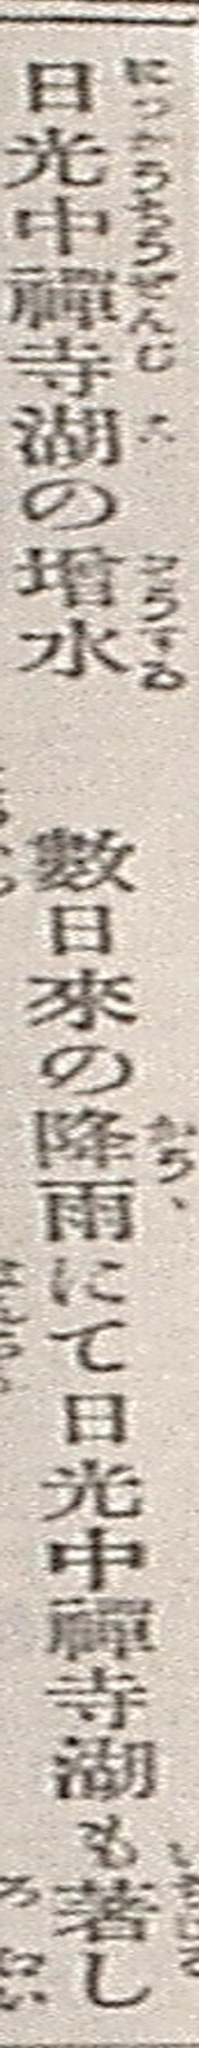日光中禅寺湖の増水数日来の降雨にて日光中禅寺湖も著し
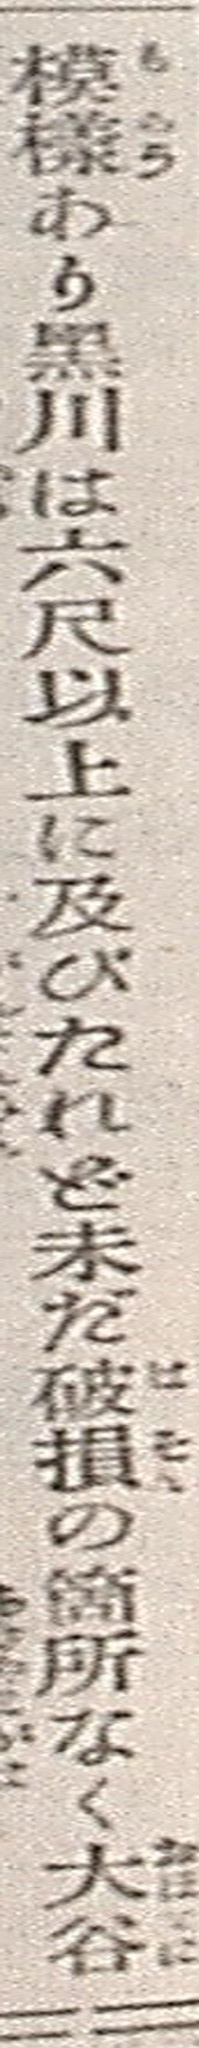模様あり黒川は六尺以上に及びたれど未だ破損の箇所なく大谷
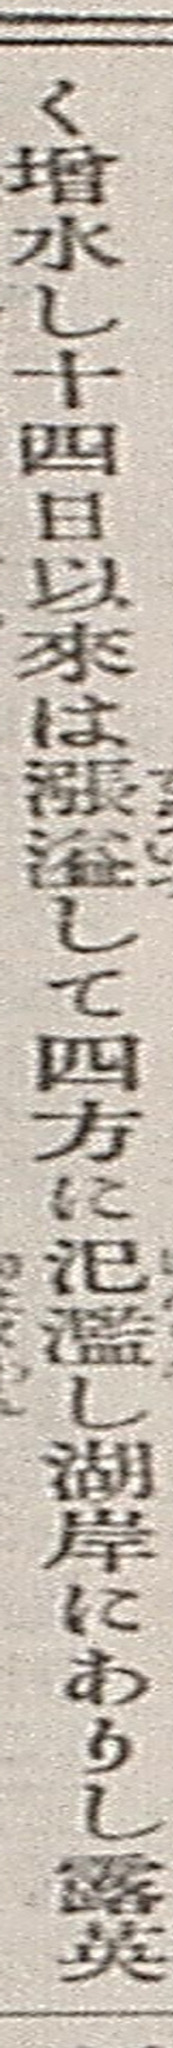く増水し十四日以来は漲溢して四方に氾濫し湖岸にありし露英
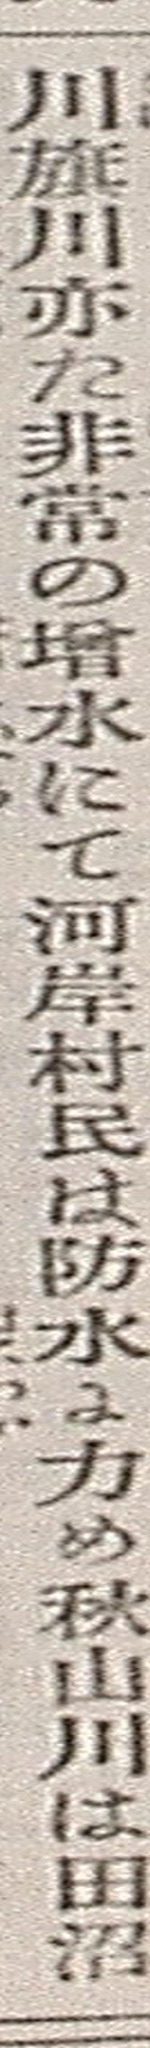川旗川亦た非常の増水にて河岸村民は防水に力め秋山川は田沼
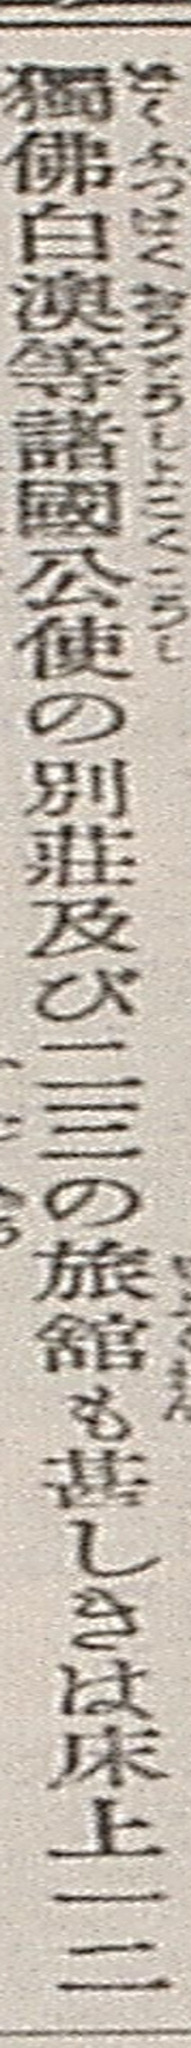独佛白澳等諸国公使の別荘及び二三の旅館も甚しきは床上一二
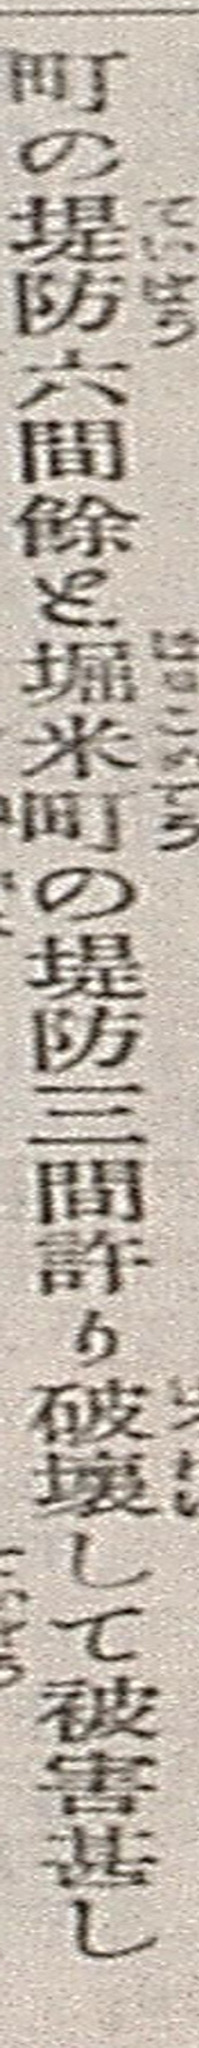町の堤防六間餘と堀米町の堤防三間許り破壊して被害甚し
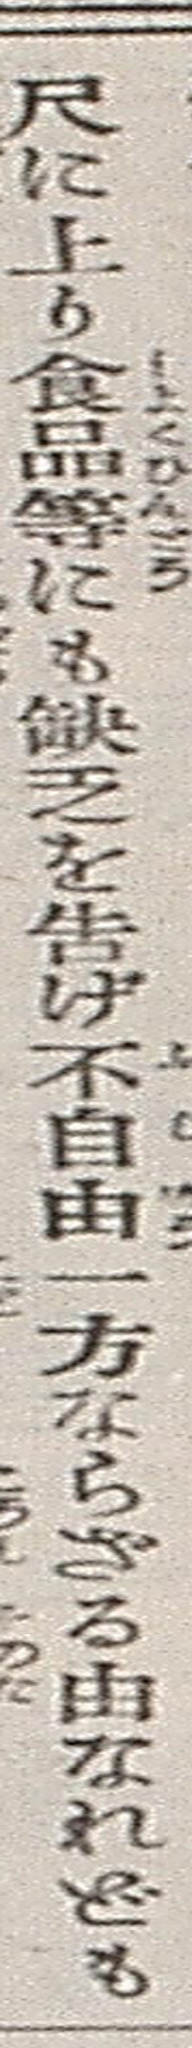尺に上り食品等にも缺乏を告げ不自由一方ならざる由なれども
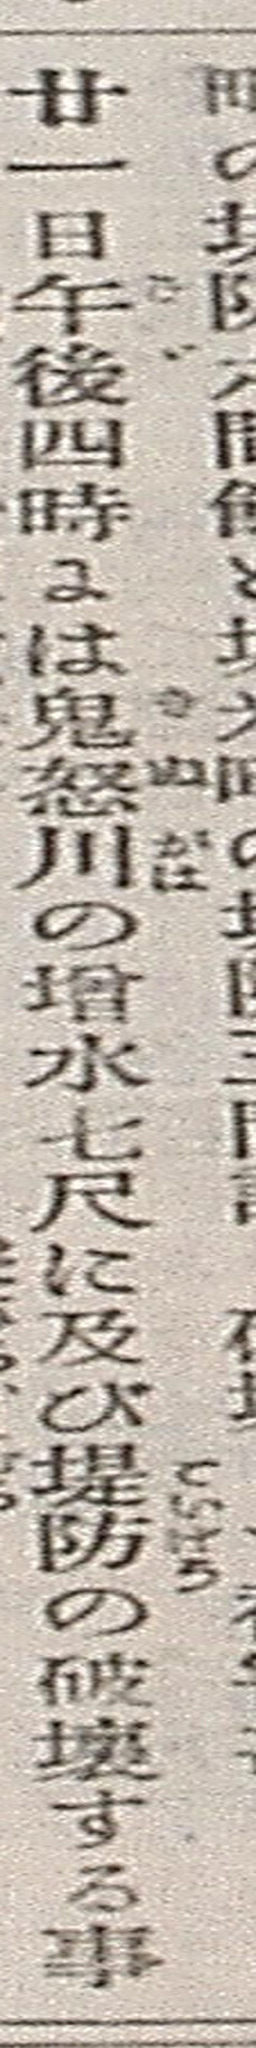廿一日午後四時には鬼怒川の増水七尺に及び堤防の破壊する事
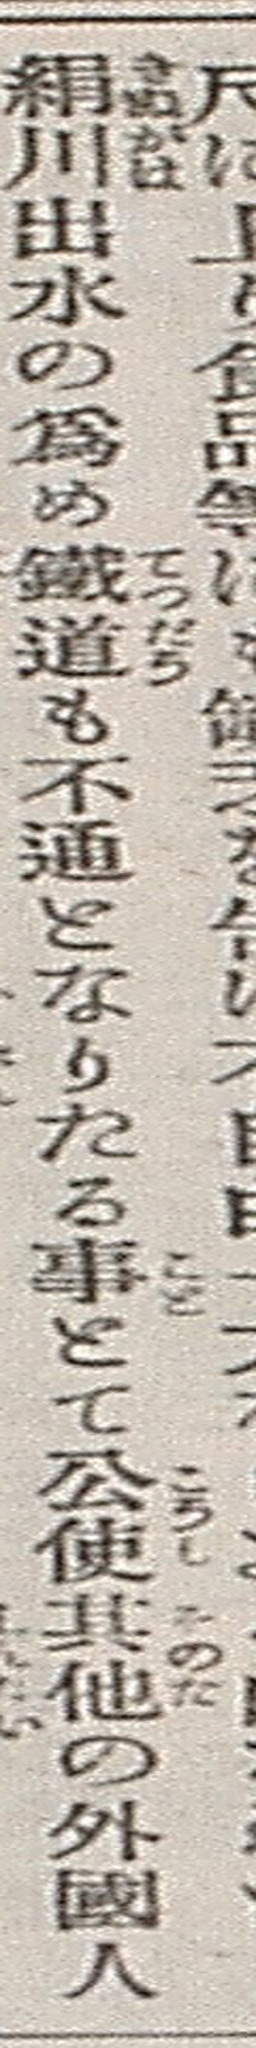絹川出水の為め鉄道も不通となりたる事とて公使其他の外国人
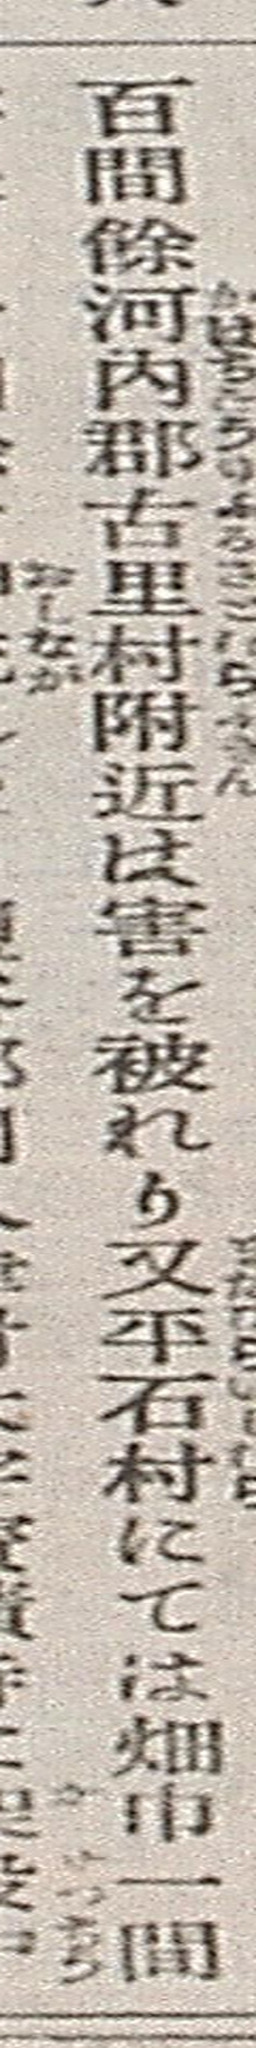百間餘河内郡古里村附近は害を被れり又平石村にては畑巾一間
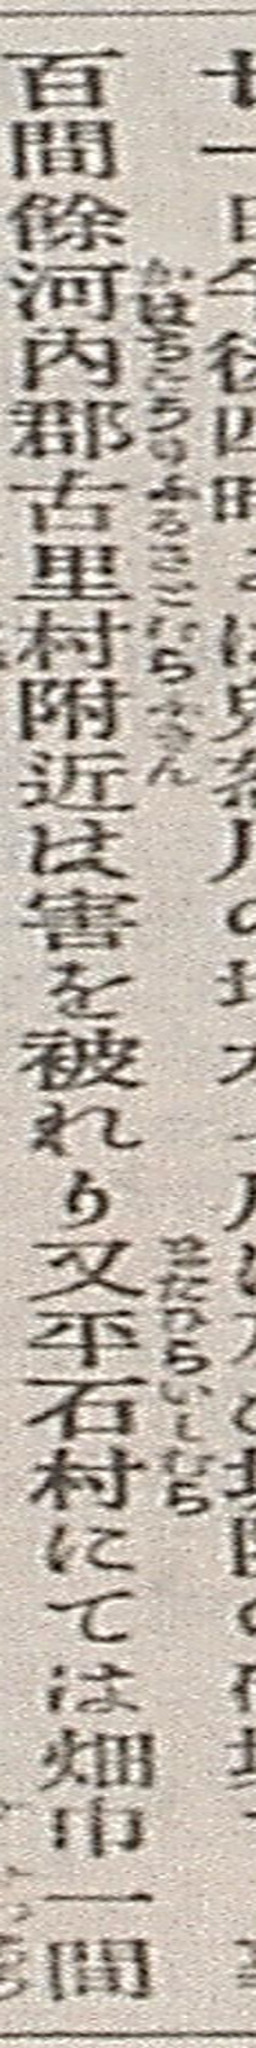百間餘河内郡古里村附近は害を被れり又平石村にては畑巾一間
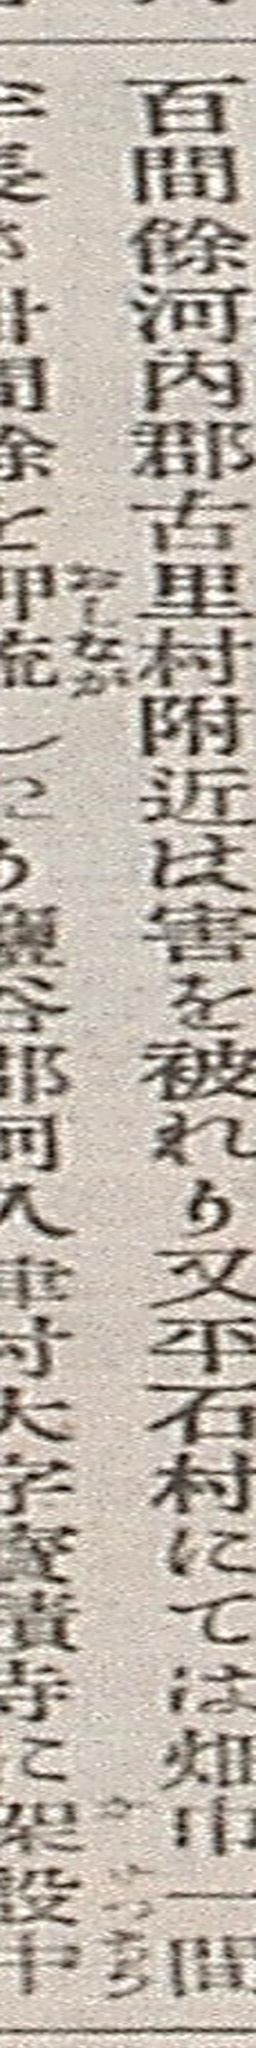半長さ卅間餘を押流したり鹽谷郡阿久津村大字寶積寺に架設中
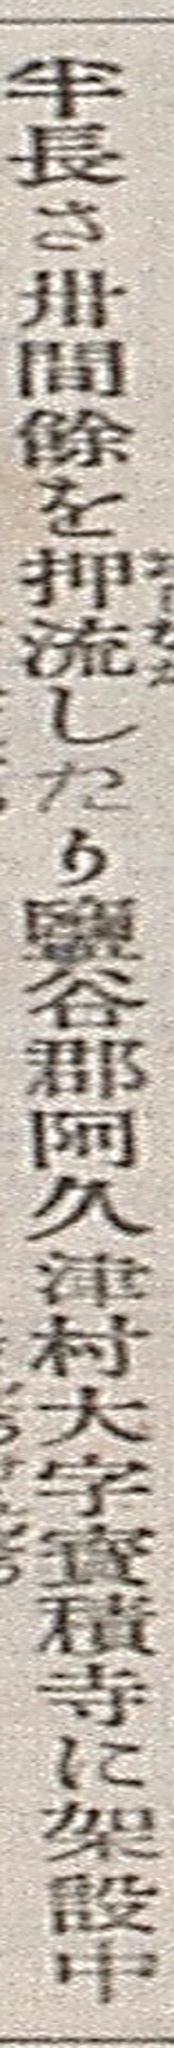半長さ卅間餘を押流したり鹽谷郡阿久津村大字寶積寺に架設中
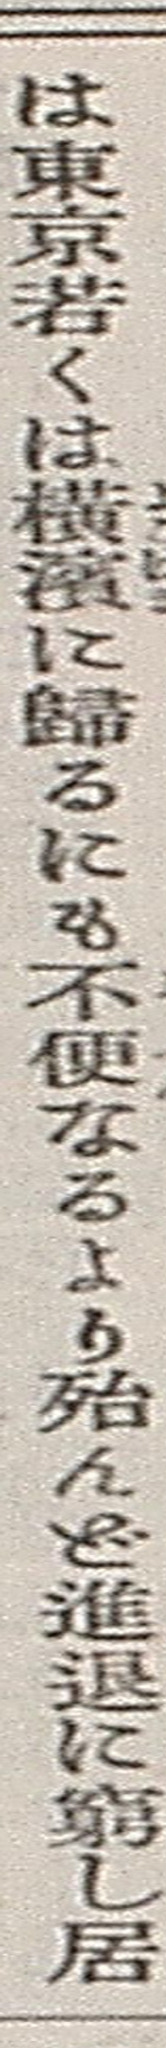は東京若くは横浜に帰るにも不便なるより殆んど進退に窮し居
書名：風俗畫報臨時増刊第百二十八號　洪水被害録（下）
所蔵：東京大学地震研究所図書室 Earthquake Research Institute Library, The University of Tokyo, JAPAN
